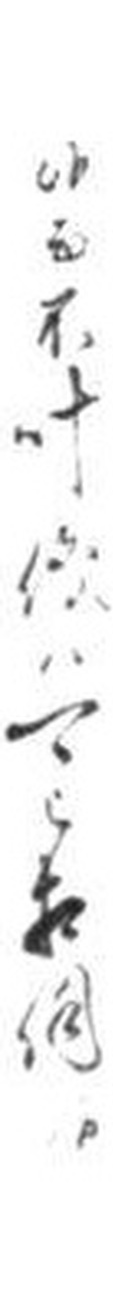候而不叶儀ハ可被相伺候
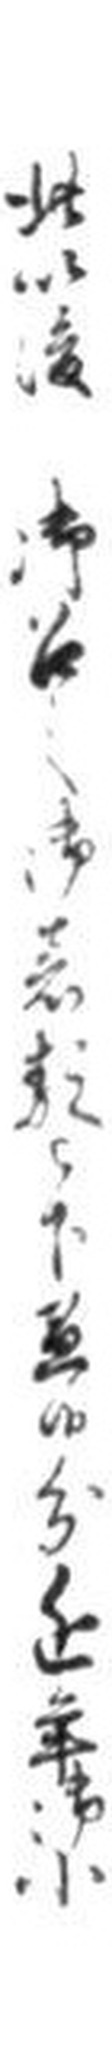此以後御召之御着類被下置候分近年御小
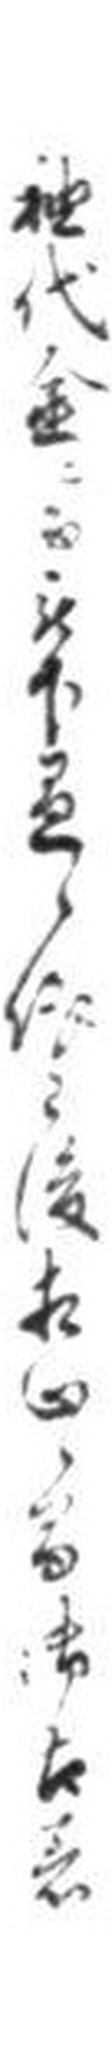袖代金ニ而被下置候儀已後相止候間御古着
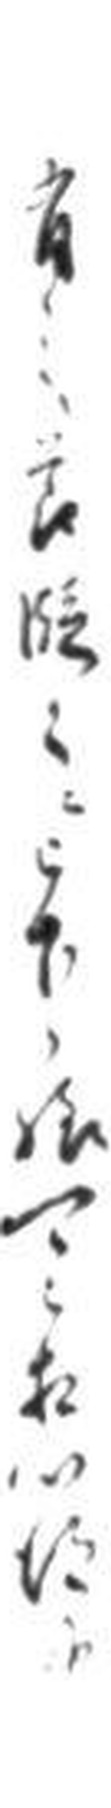有之節段々ニ被下候様可被相心得候
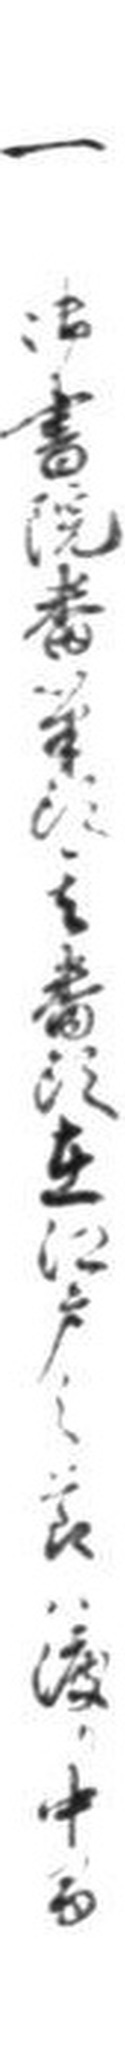一御書院番筆頭其番頭在江戸之節ハ渡り中間
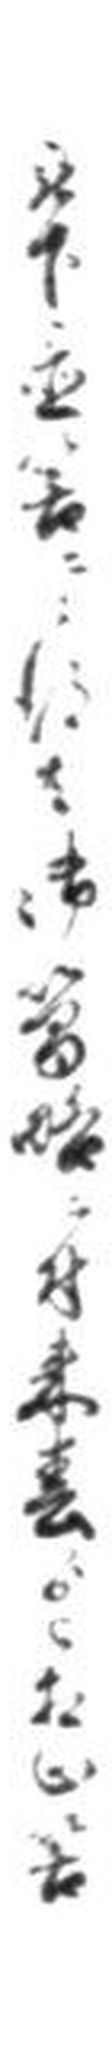被下置筈ニ候得共御簡略ニ付来春ゟ被相止筈
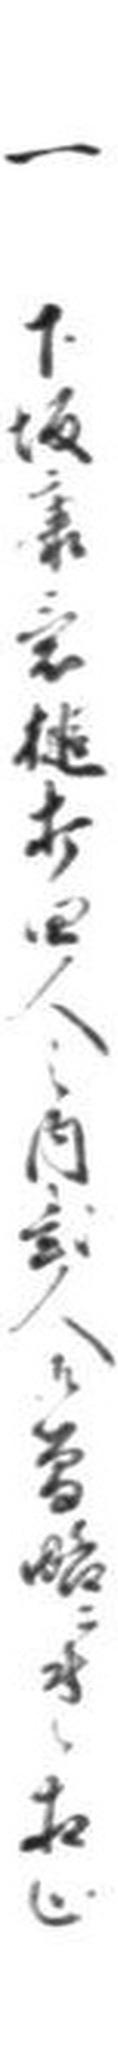一下坂康意槌打四人之内弐人御簡略ニ付被相止
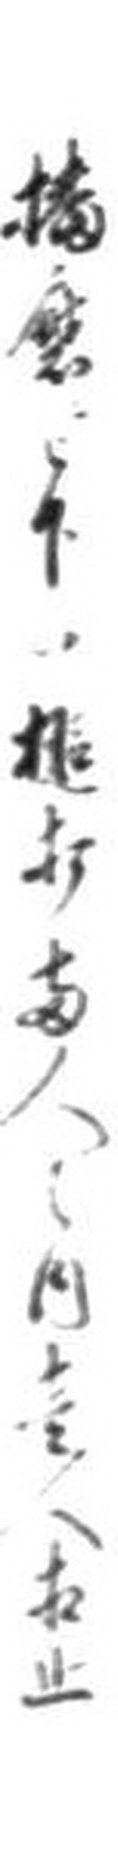播磨江被下候槌打両人之内壱人相止
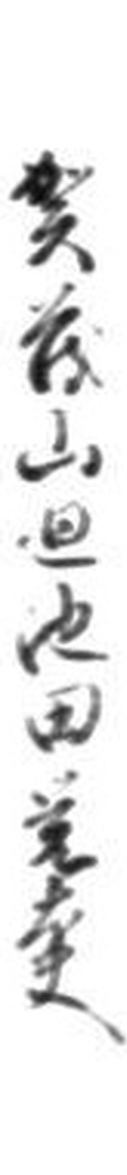賀茂山廻池田覚太夫
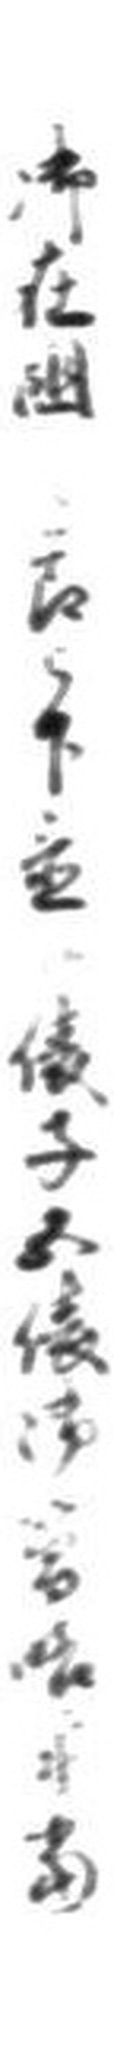御在国之節被下置候俵子五俵御簡略ニ付当
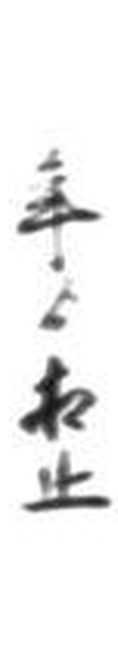年ゟ相止
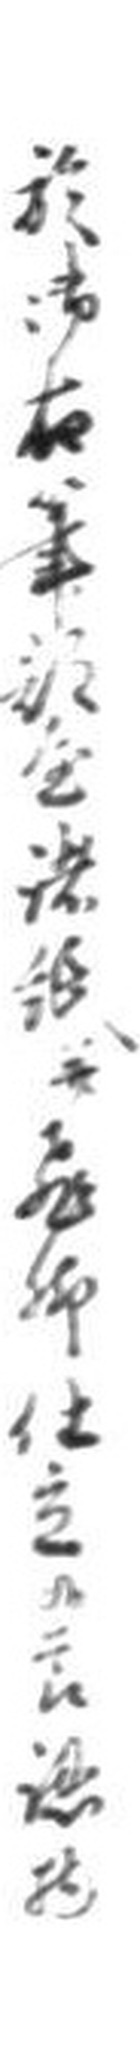於御右筆部屋諸紙并飛脚仕立候節認物
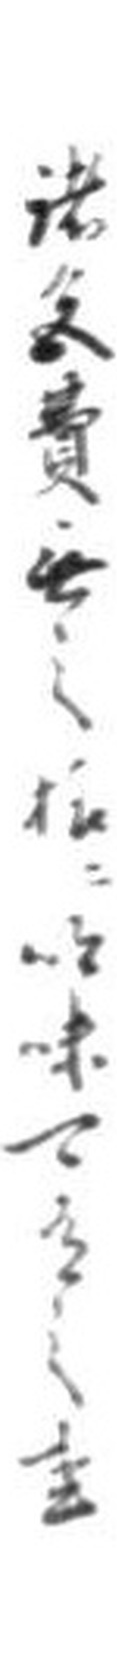諸色費無之様ニ吟味可有之事

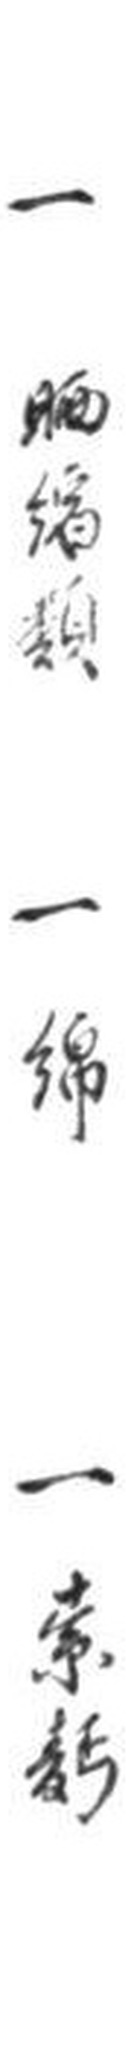一晒縮類一綿一素麪
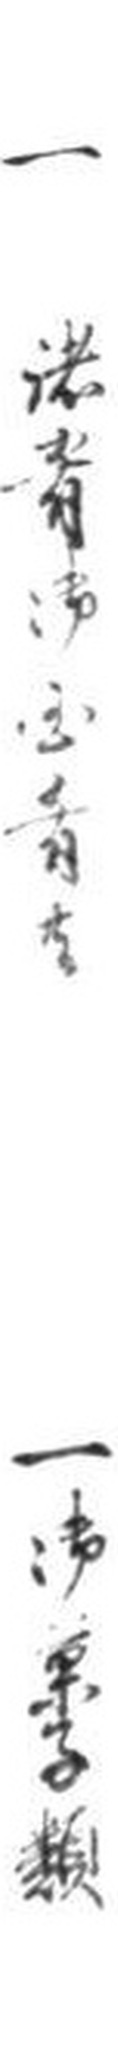一諸肴御国肴共一御菓子類
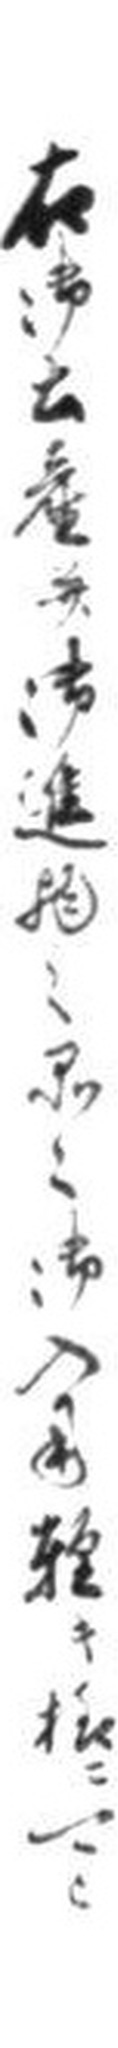右御土産并御進物之品々御入用軽キ様ニ可被
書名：家譜 三十六 宗昌公 従享保八年到同九年
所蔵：福井県文書館 Fukui Prefectural Archives
